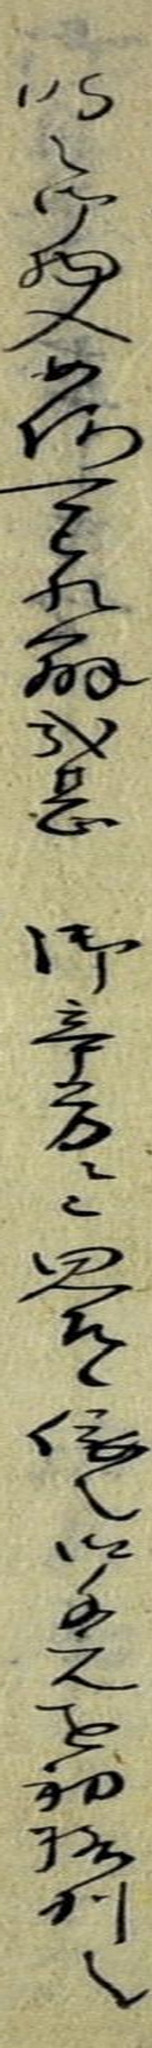時之御物入如何可被相弁哉甚御辛労に被思召候依之御手元を初格別之
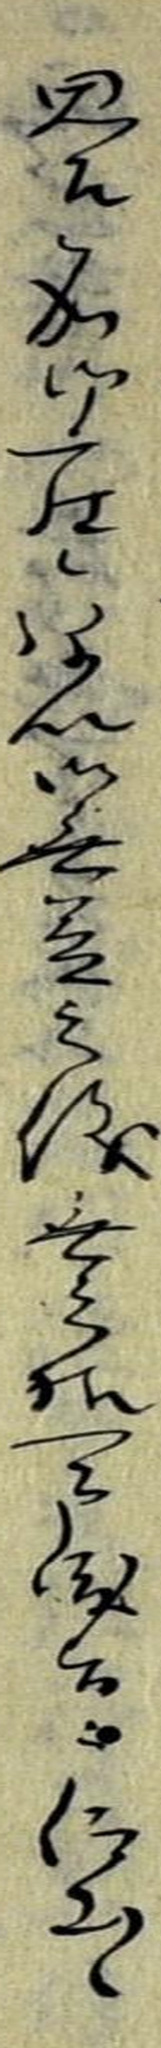思召被成御座候弥以御無益之儀無之様可被申渡旨被仰出候
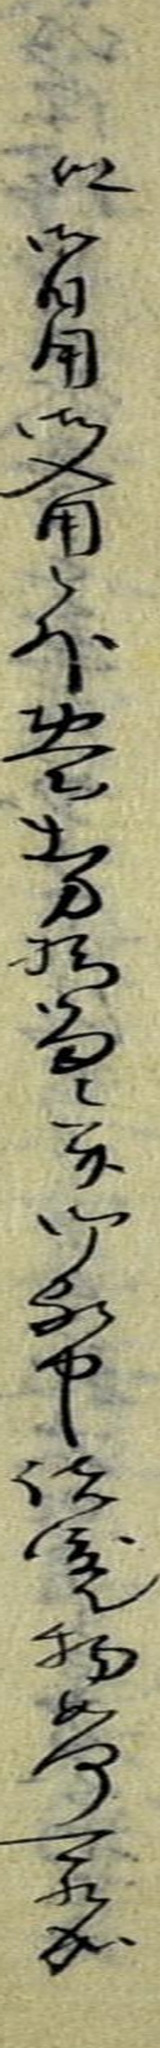但御日用御入用之外惣而出方指留之并御家中諸渡し物如何可相成
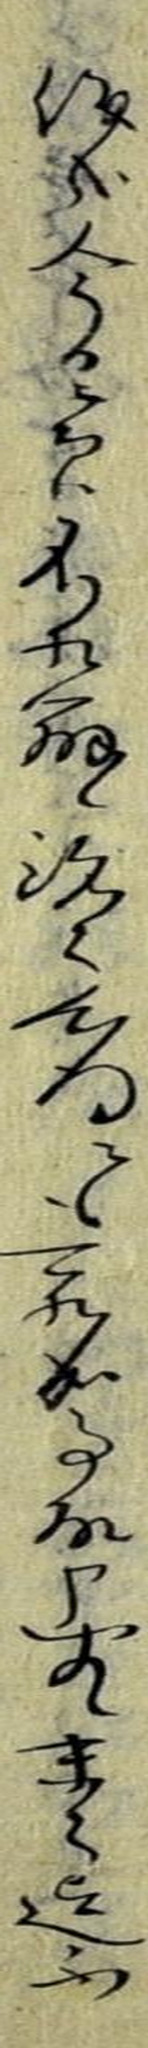儀哉今日に而は不相弁候銘々心得にも可相成事故申聞候末々迄不
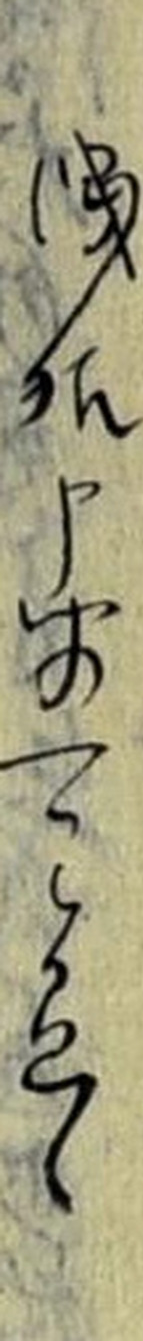洩様申聞可被下置候
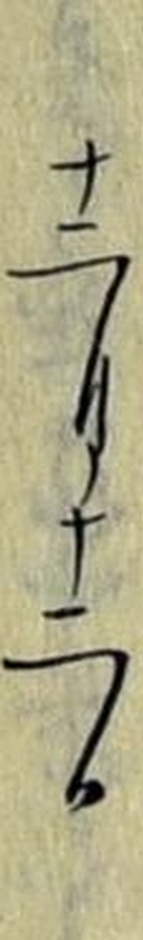十一月十二日
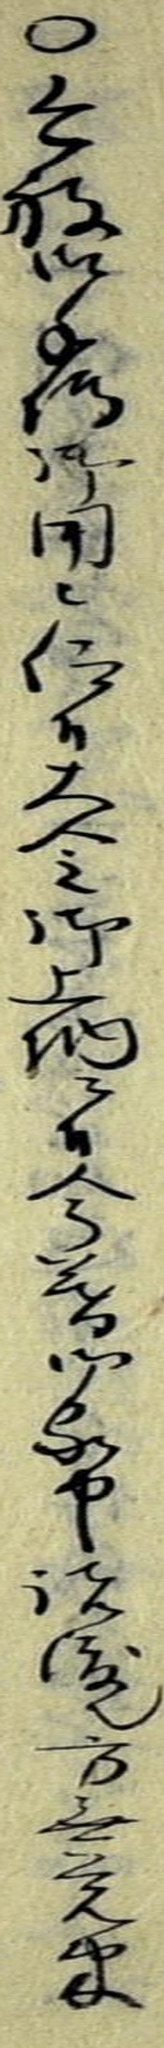○今般御手伝御用被仰付大金御上納に付今暮御家中諸渡し方無覚束
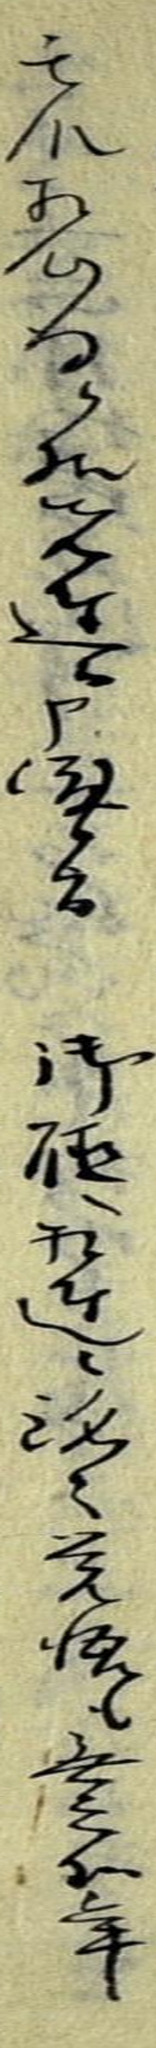其段相心得候様先達而申渡候旨御聴へ相達候銘々覚悟も無之処年
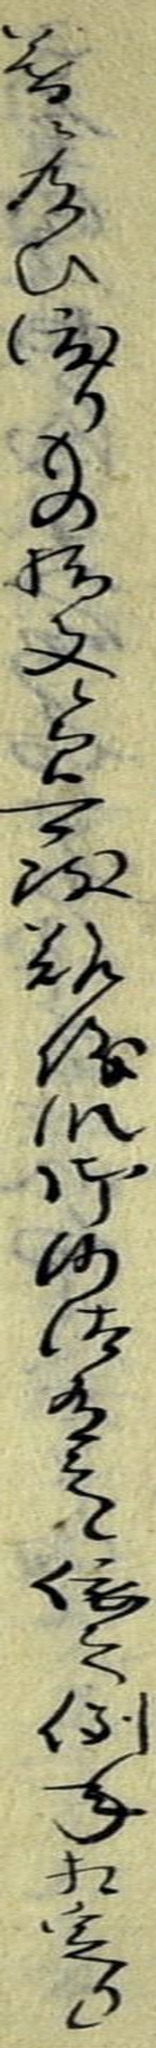暮に及ひ渡りもの指支候而は可致難儀段御沙汰有之候依之例年相定り候
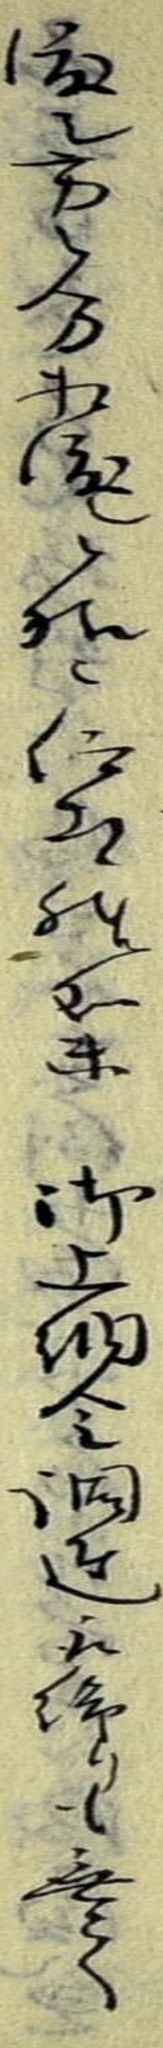渡し方之分相渡し候様被仰出候然ル処未御上納金調達取締りも無之

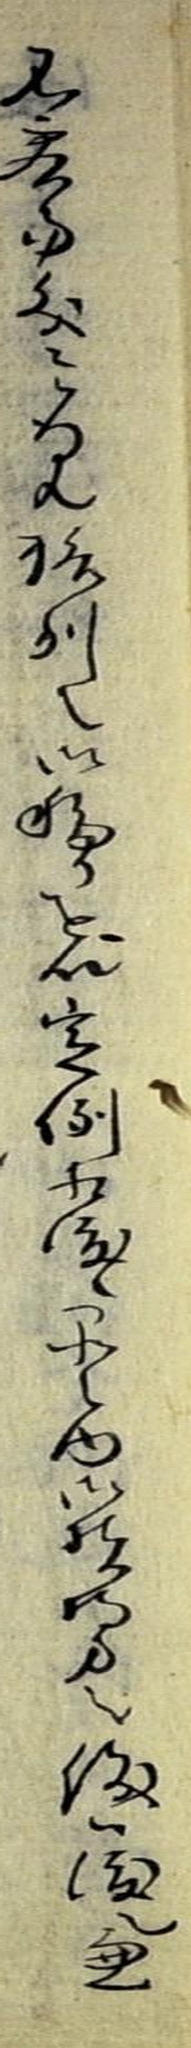不容易義に候得共格別之御移りを以定例相渡候品之内御扶持方之儀は渡し兼
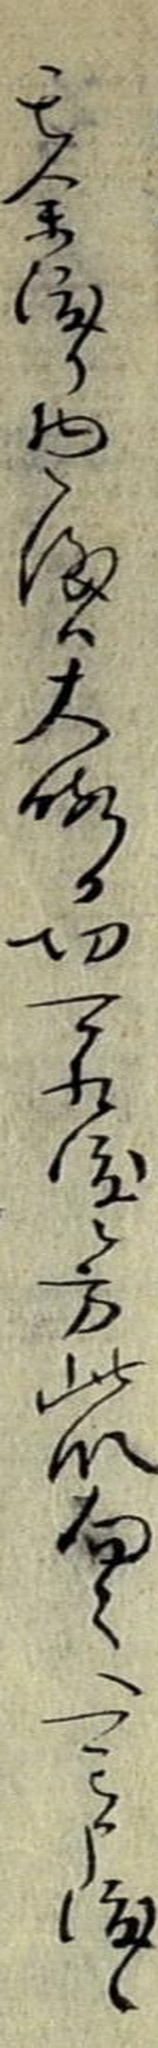其余渡り物之儀ハ大晦日切可相渡候方此段面々へ可被申渡之
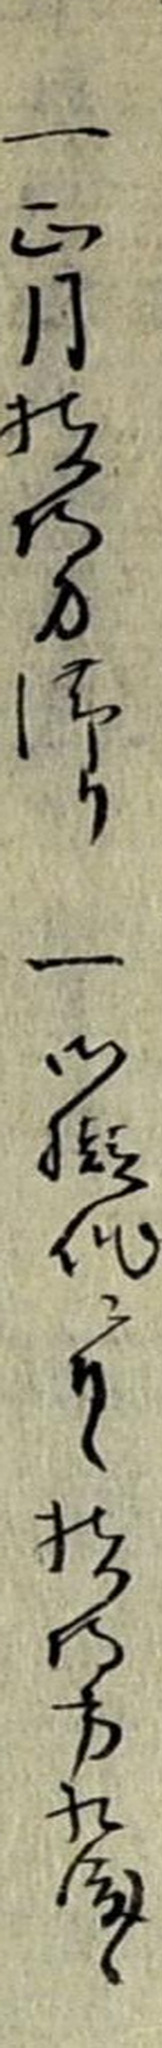一正月扶持方滞り一御擬作に付扶持方相渡候
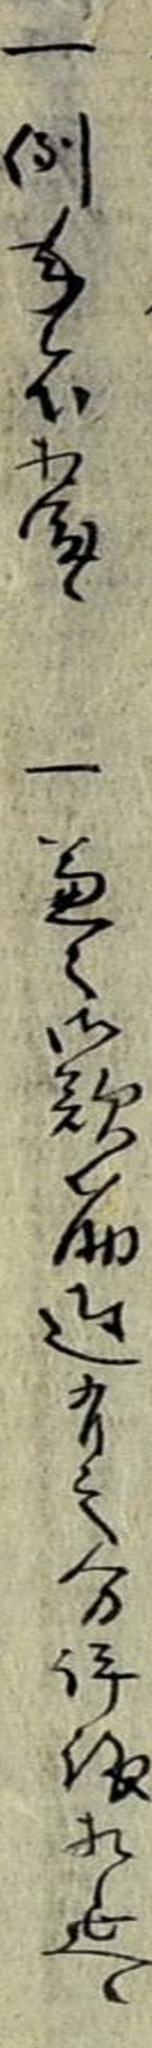一例年被下相渡候一兼々御歎筋達有之分評儀相延候
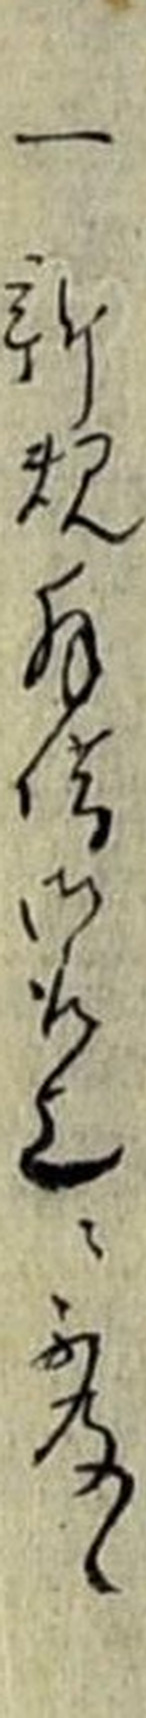一新規拝借御取上に不及候
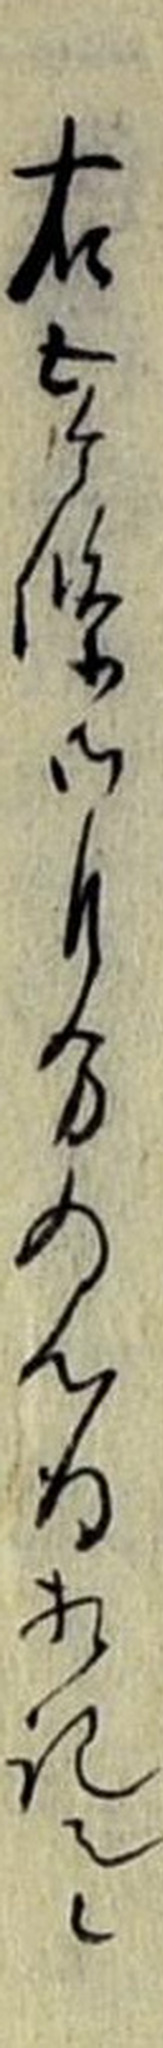右五ヶ条御自分為心得相記し候
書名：命令之部 四
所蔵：福井県文書館 Fukui Prefectural Archives
